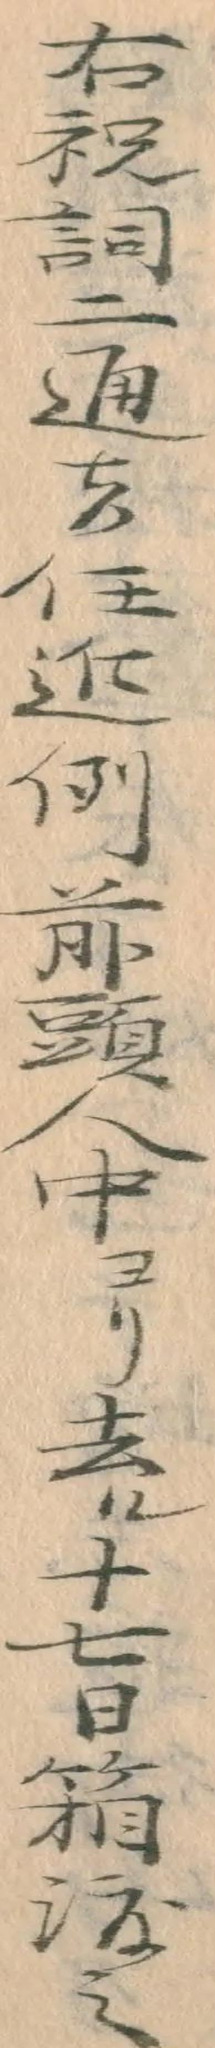右祝詞二通旨任近例前頭人中ヨリ去ル十七日箱渡之
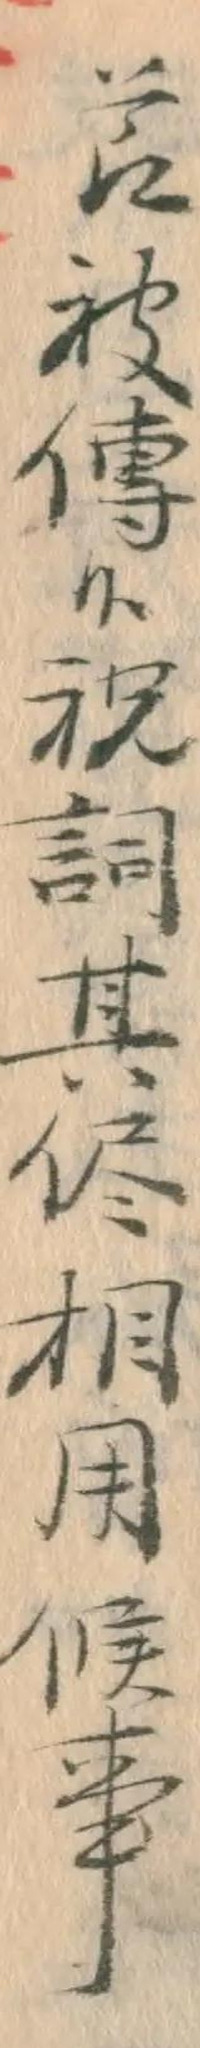節被傳候祝詞其侭相用候事
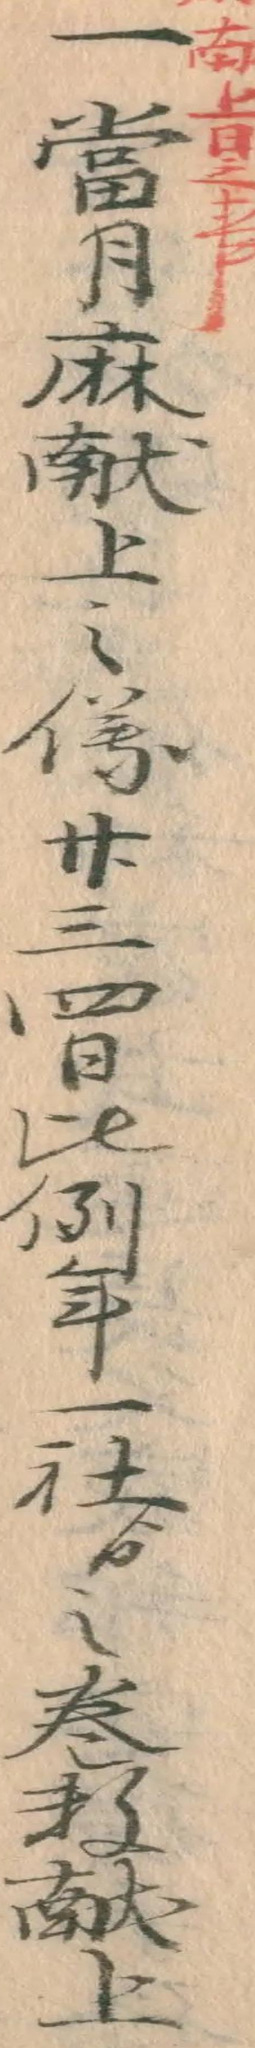一當月麻献上之儀廿三四日比例年一社ゟ之巻数献上
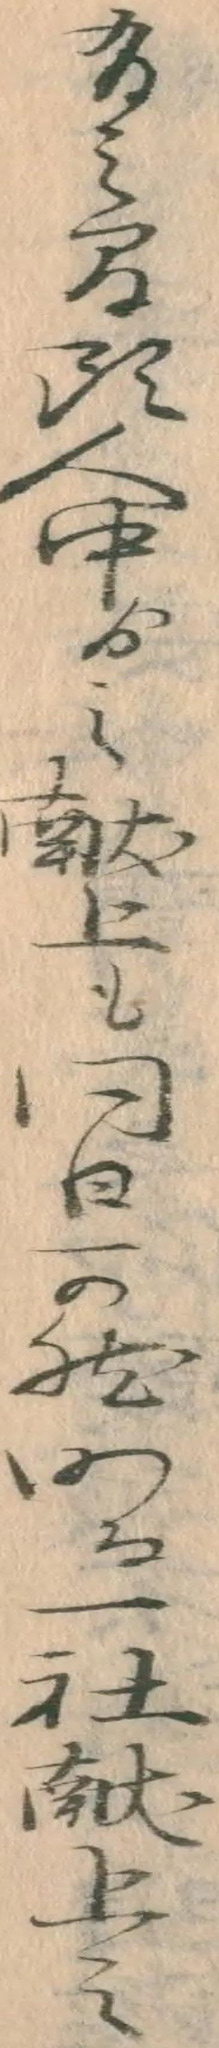有之間頭人中ゟ之献上も同日可然仍而一社献上之
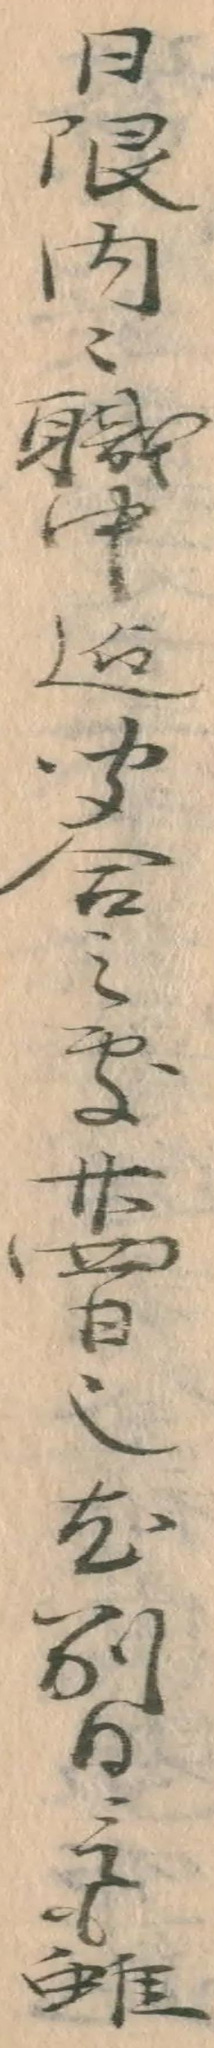日限内々職中迄聞合之處廿四日也尤別日ニても雖
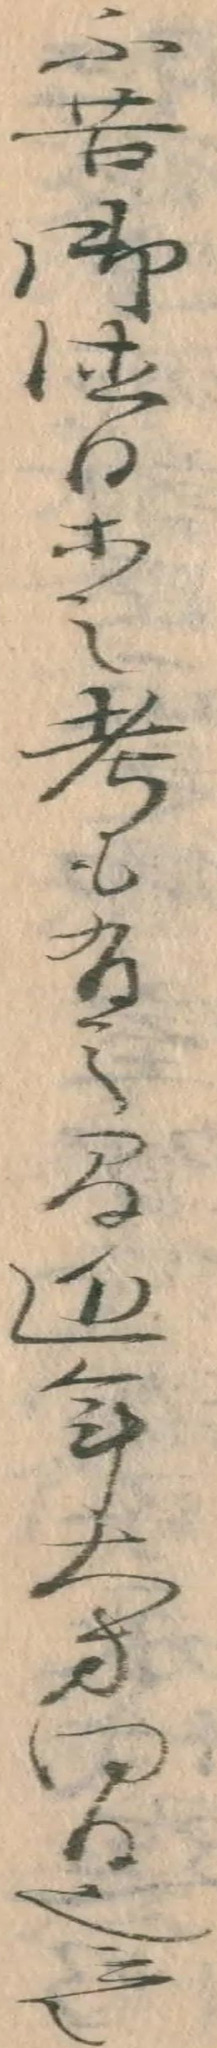不苦御徳日等之考も有之間近年大方同日也云々
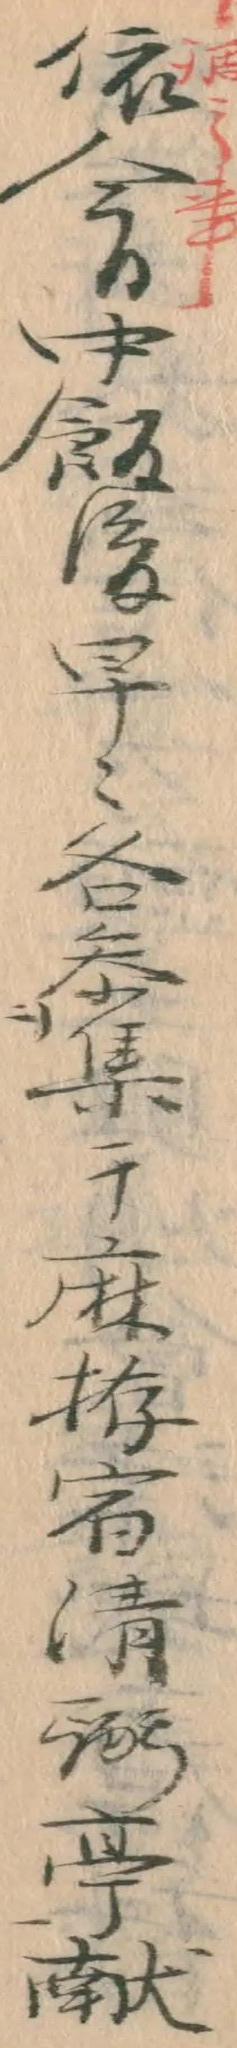依今日中飯後早々各参集于麻拵宿清弼亭献
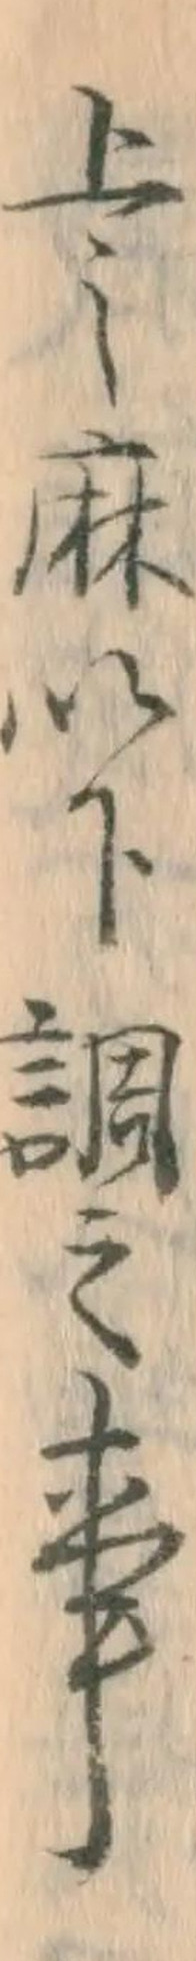上之麻以下調之事
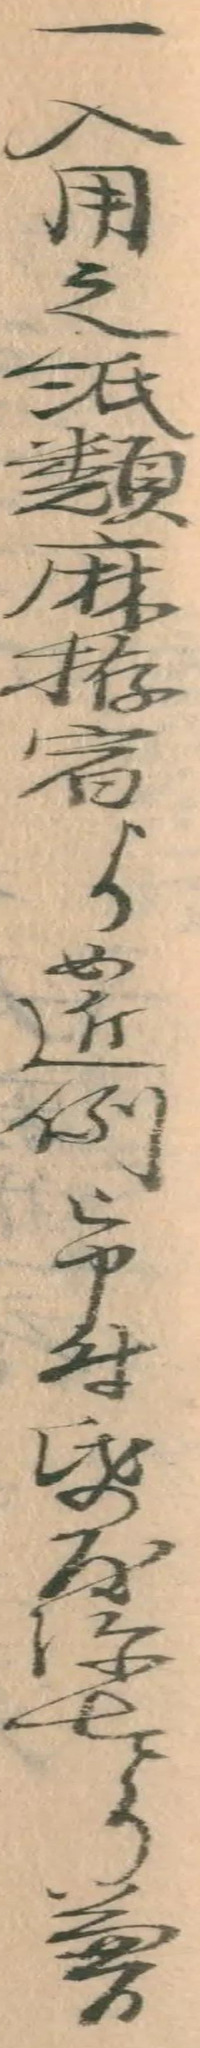一入用之紙類麻拵宿より如近例被申付帋反弥七より兼而
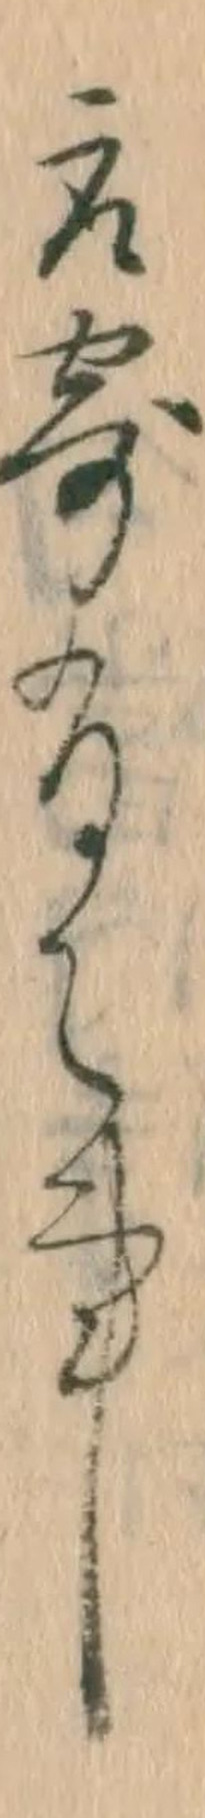取寄有之事
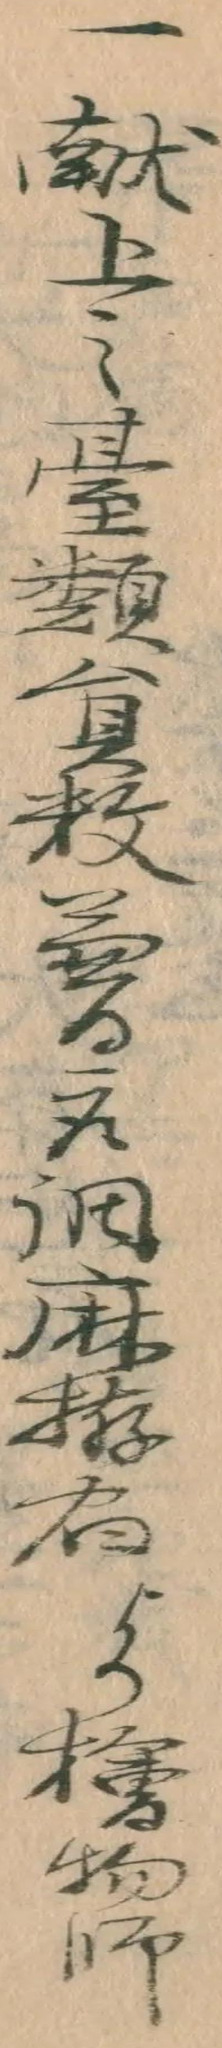一献上之臺類員数兼日取調麻拵有より檜物師
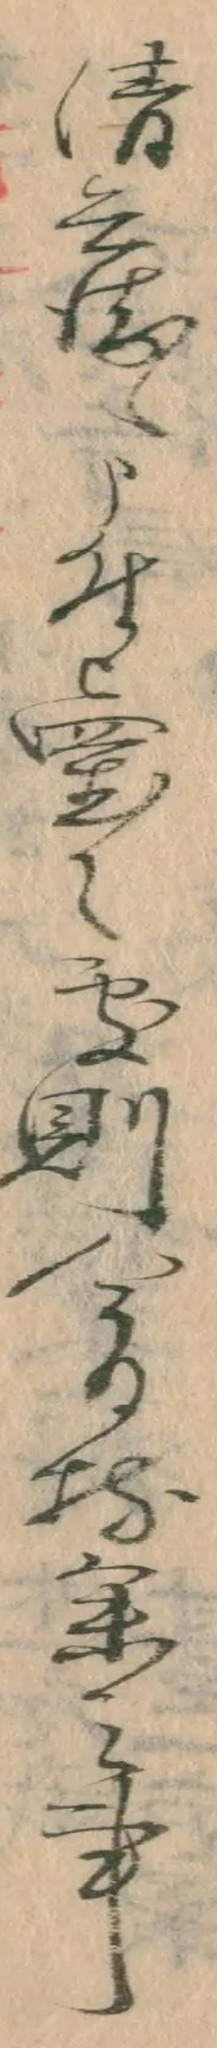清兵衛へ申付被置之處則今日持参之事
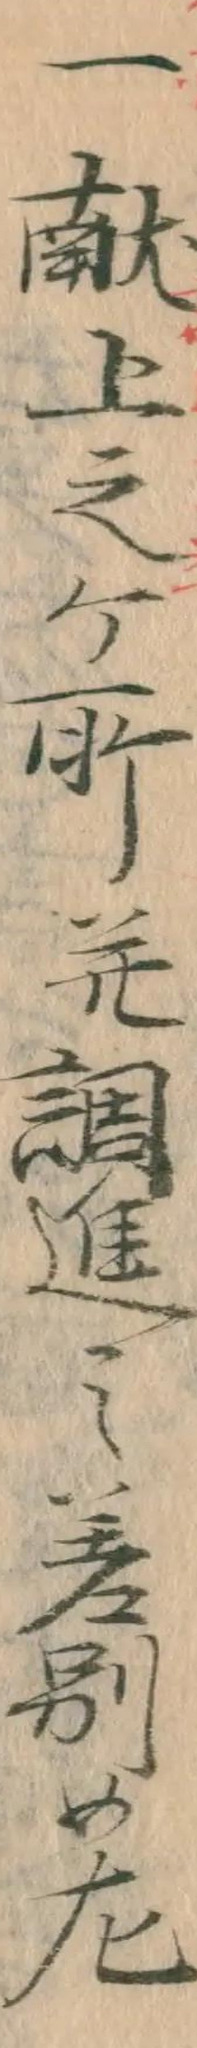一献上之ケ所并調進之差別如左
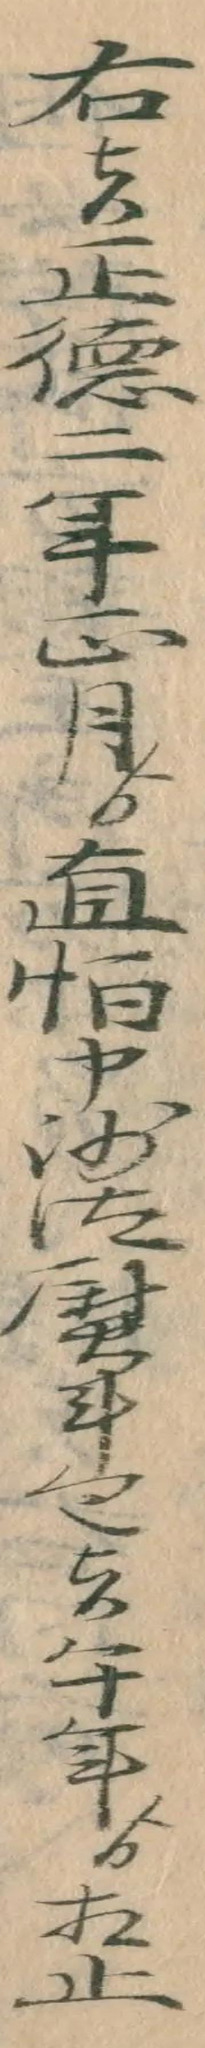右者正徳二年正月ゟ直恒申沙汰熨斗包旨午午年ゟ相止

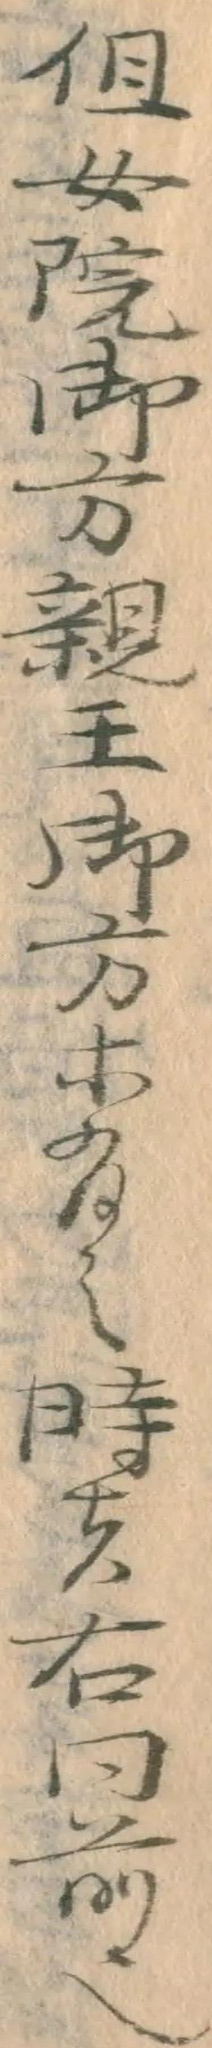但女院御方親王御方等有之時者右同前也
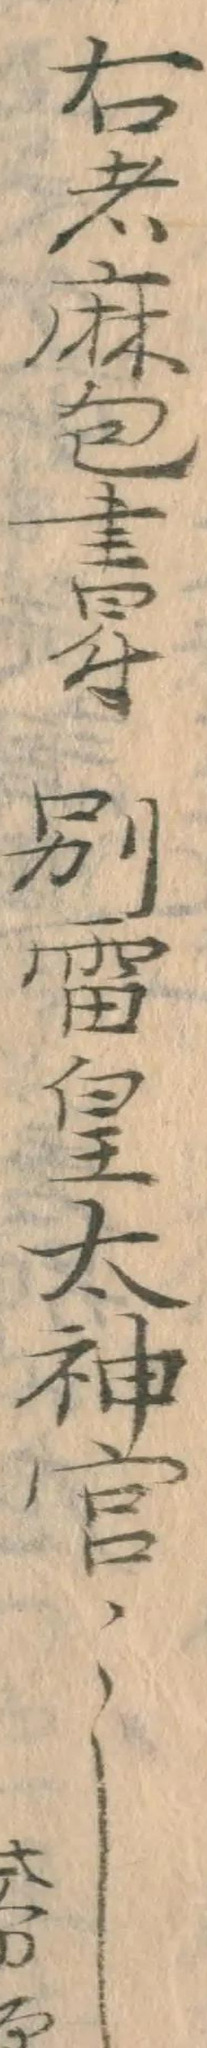右者麻包書付別雷皇太神宮
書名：賀茂社記録. 第72冊
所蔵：国立国会図書館 National Diet Library, JAPAN
